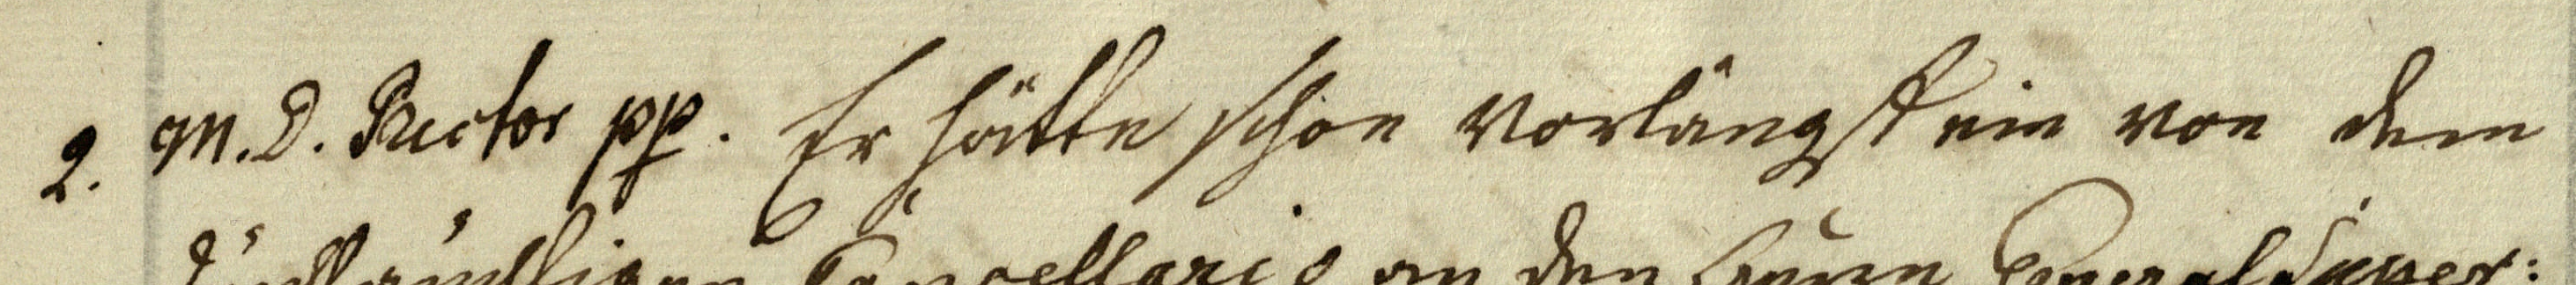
2. M. D. Rector pp. Er hätte schon vorlängst ein von dem
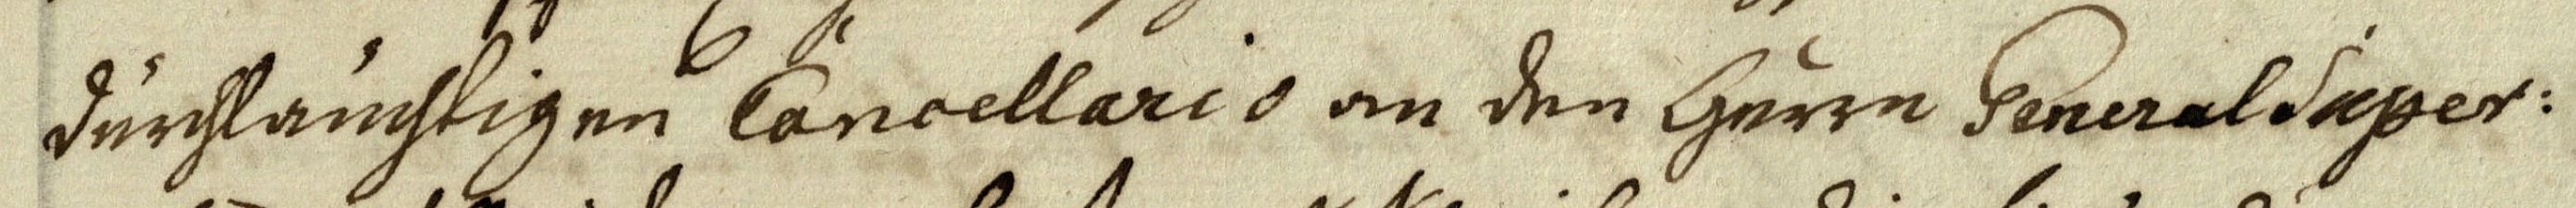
Durchläuchtigen Cancellario an den Herrn GeneralSuper¬
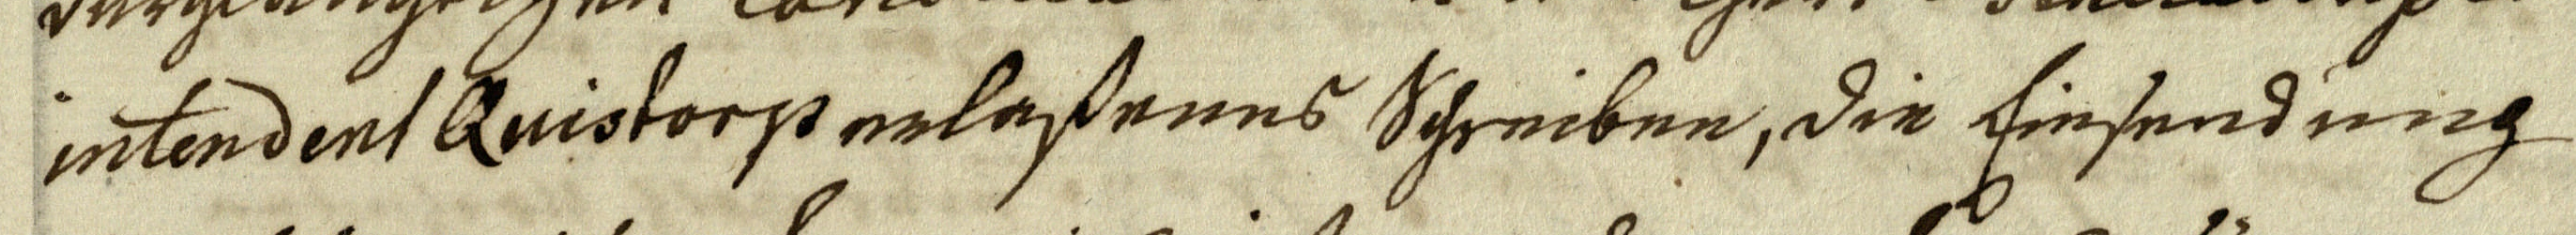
intendent Quistorp erlaßenes Schreiben, die Einsendung
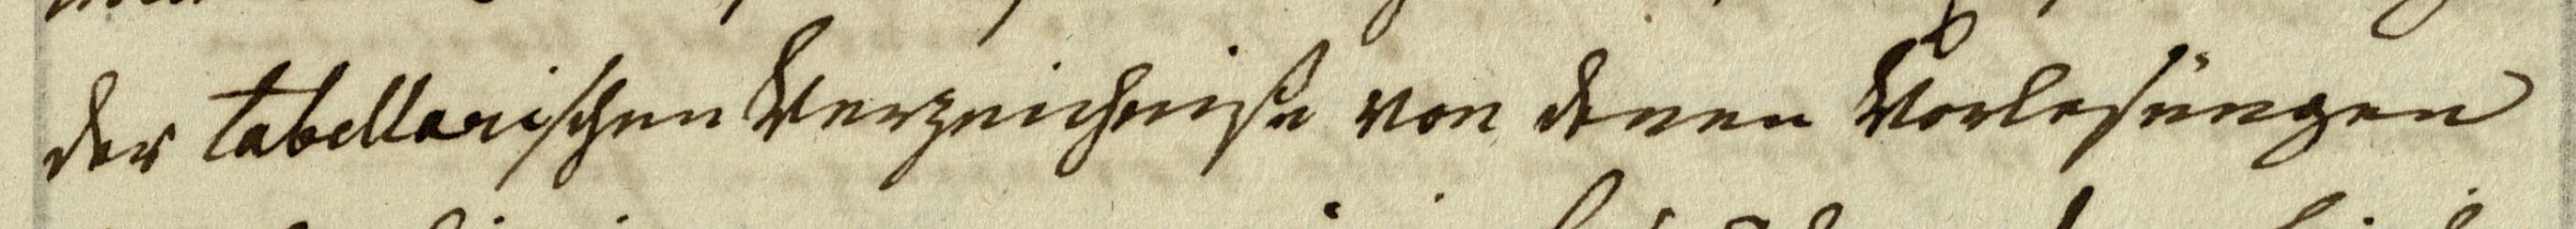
der tabellarischen Verzeichniße von denen Vorlesungen
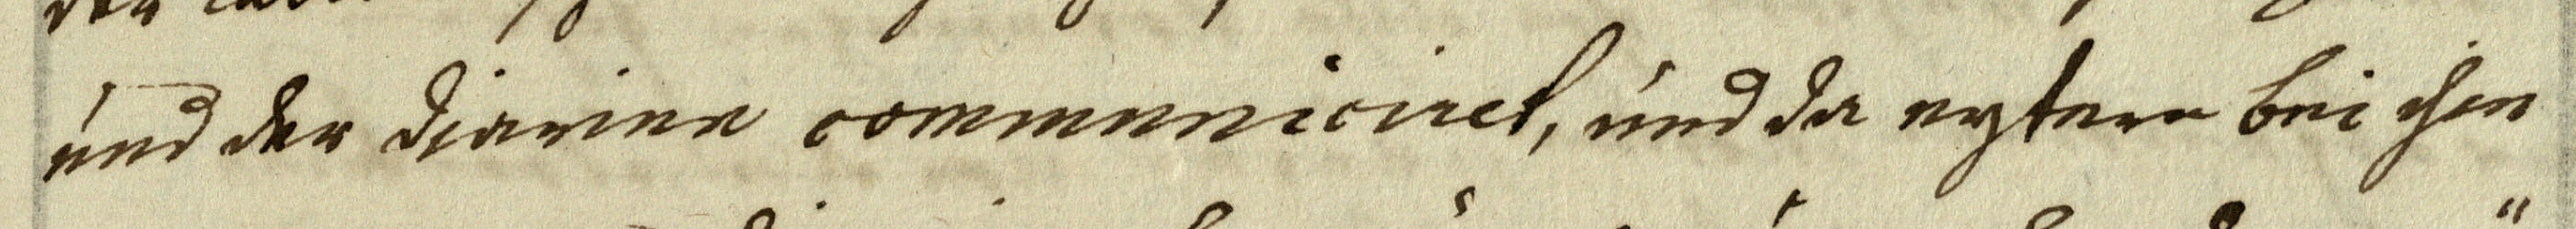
und der diarien communiciret, und da erstere bei ihm
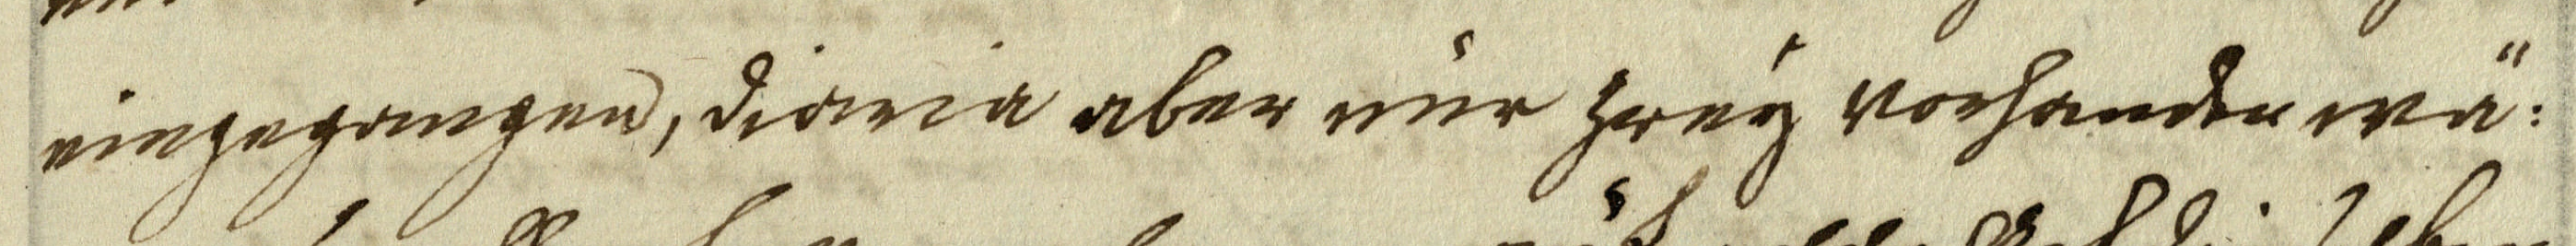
eingegangen, diaria aber nur zweÿ vorhanden wä¬
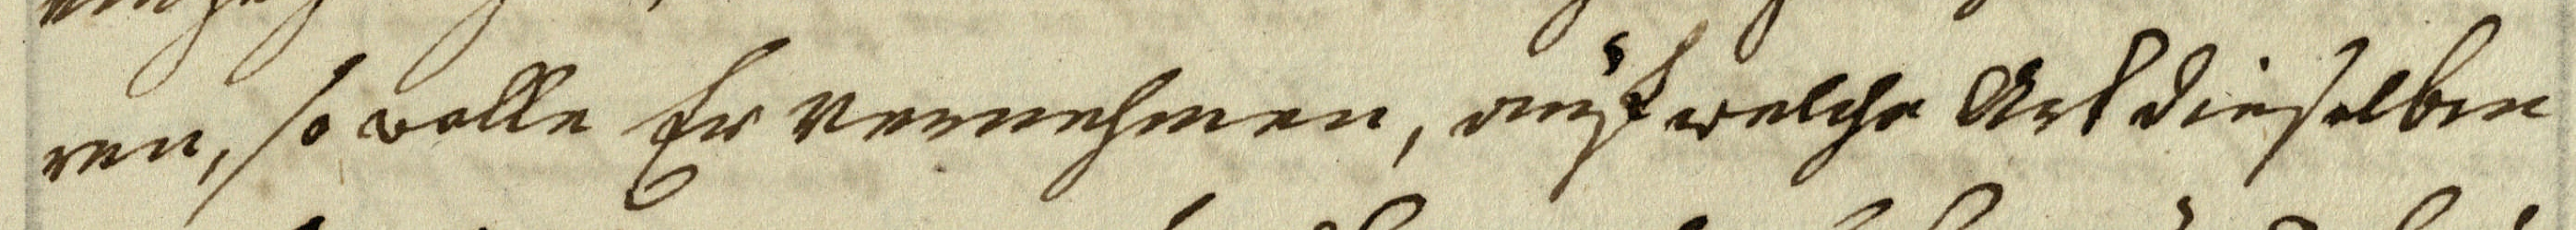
ren, so wolle Er vernehmen, auf welche Art dieselben
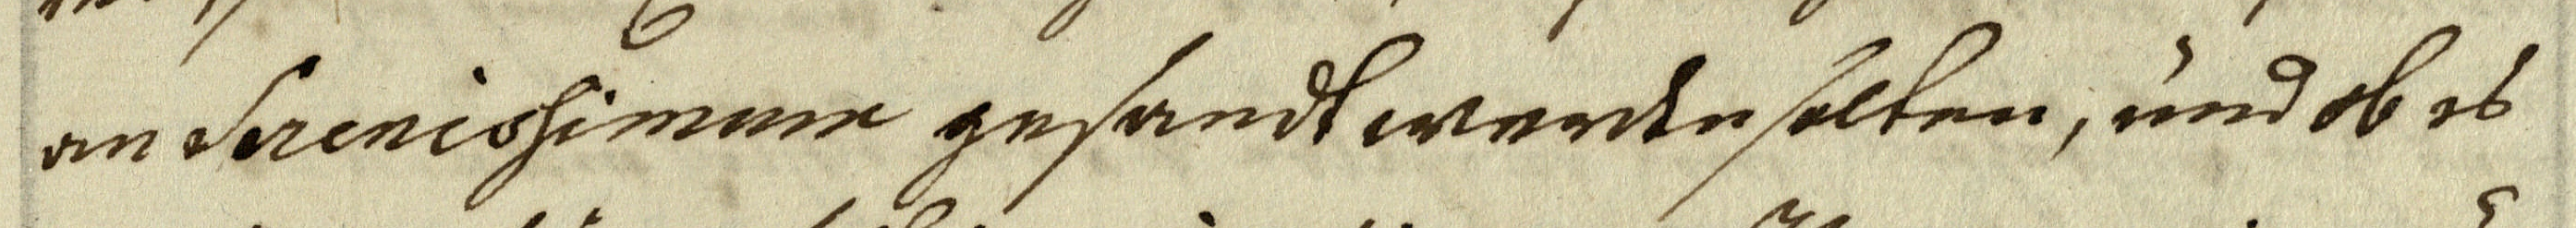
an Serimissimum gesandt werden solten, und ob es
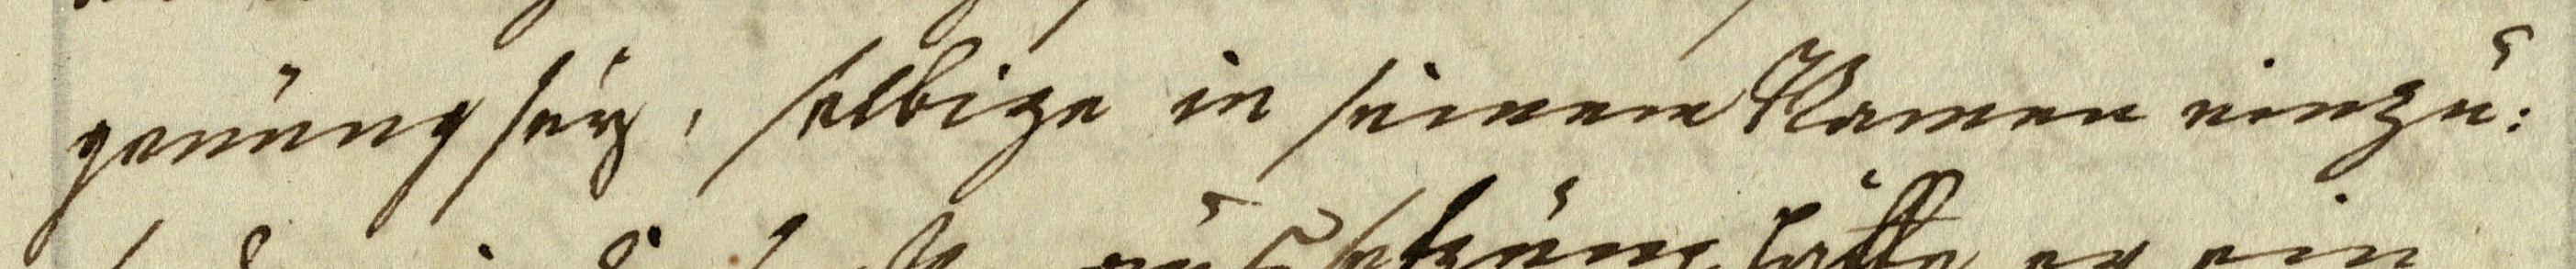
genung seÿ, selbige in seinem Namen einzu¬
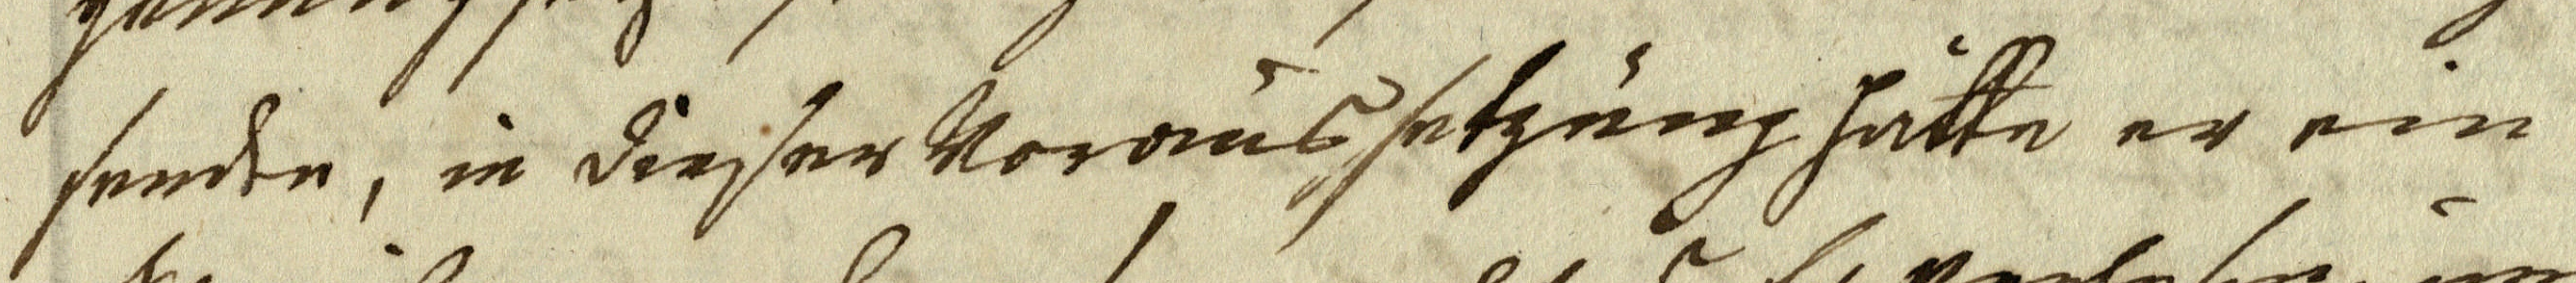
senden, in dieser Voraussetzung hätte er ein
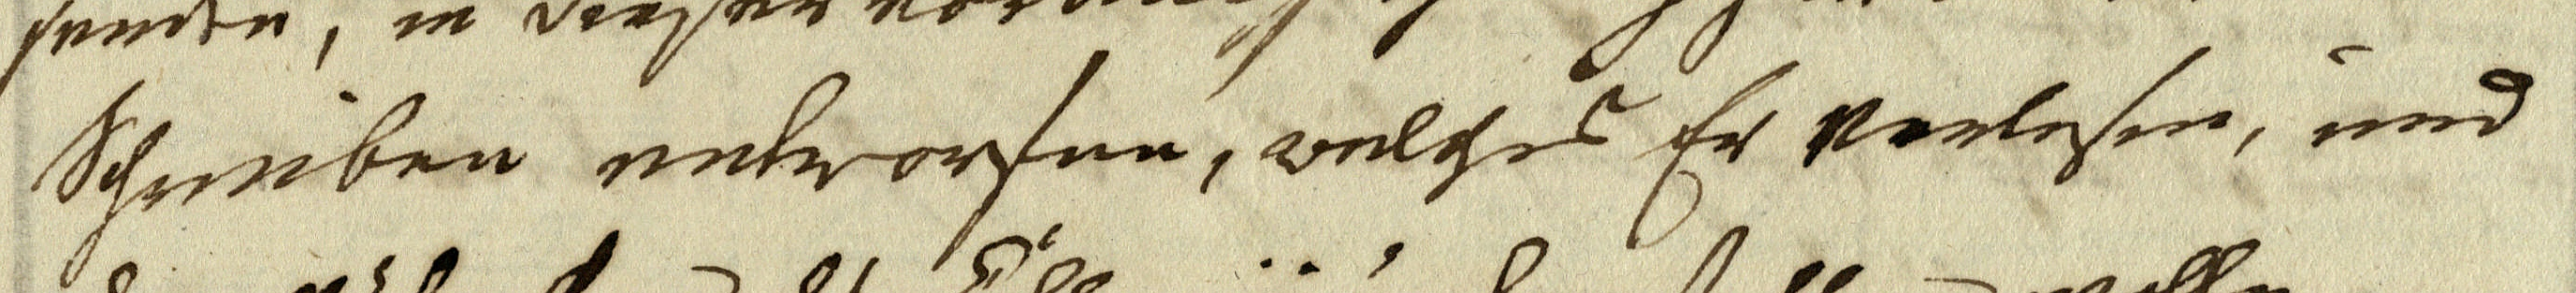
Schreiben entworfen, welches Er verlesen, und
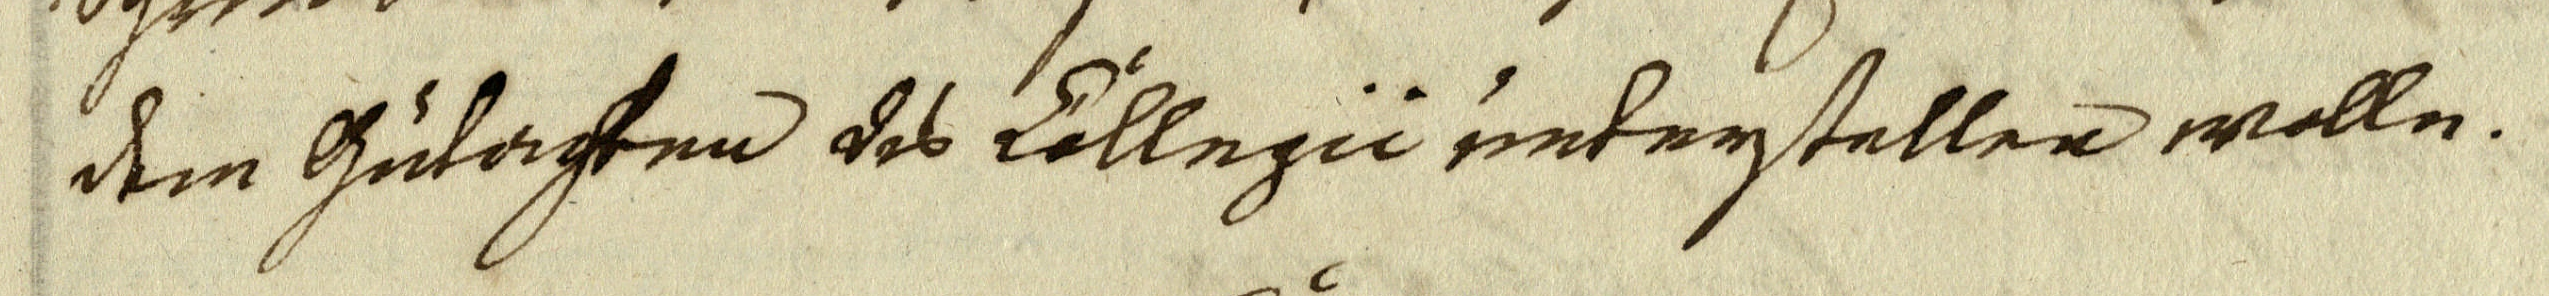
dem Gutachten des Collegii unterstellen wolle.
